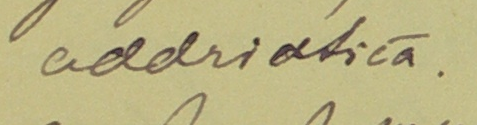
addriatica.
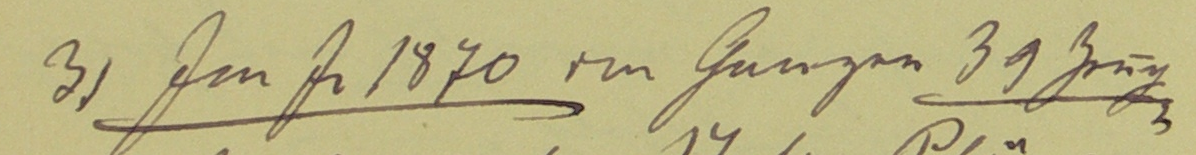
3) Im Jahr 1870 im ganzen 39 Zeug¬
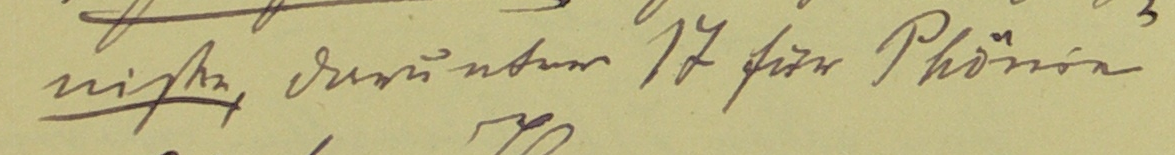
niße, darunter 17 für Phönix
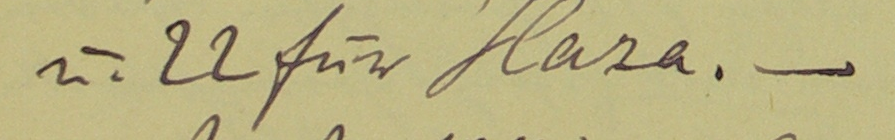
und 22 für Tlara.-
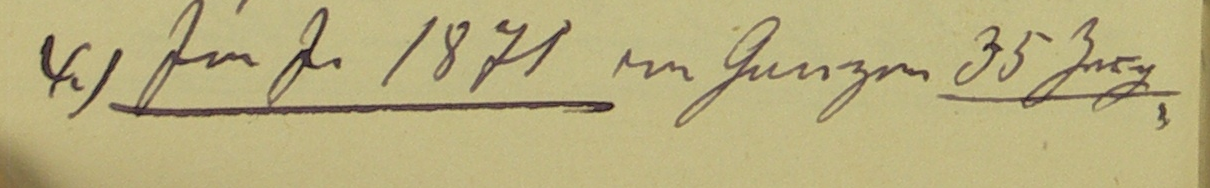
4) Im J. 1871 im Ganzen 35 Zeug¬
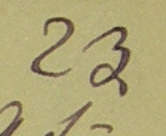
23
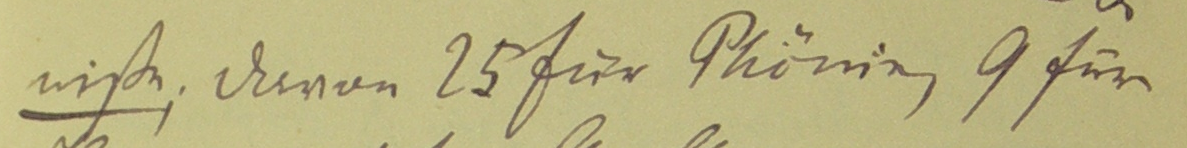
niße, davon 25 für Phönix, 9 für
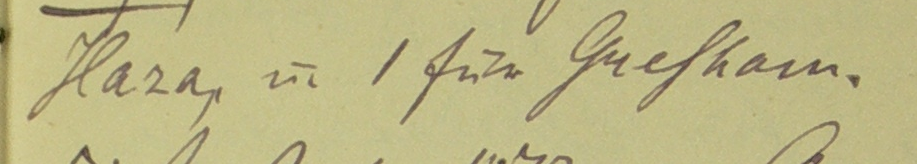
Tlara und 1 für Hestony.
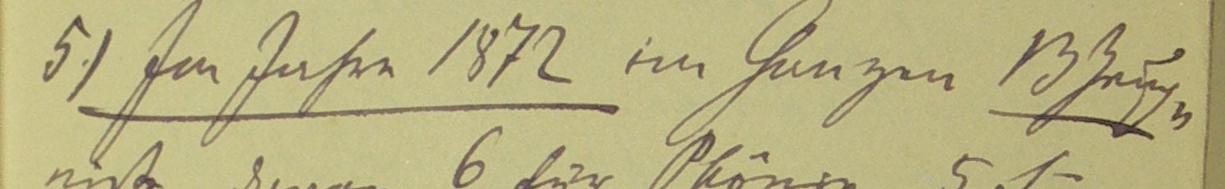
5) Im Jahre 1872 im Ganzen 13 Zeug¬
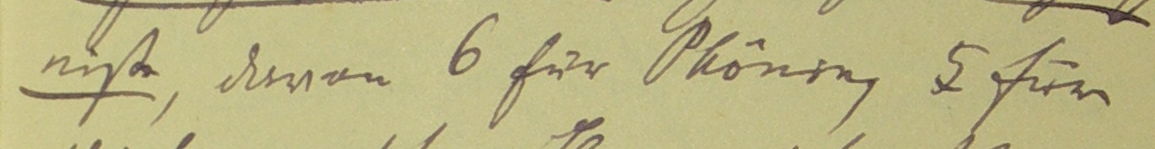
niße, davon 6 für Phönix, 5 für
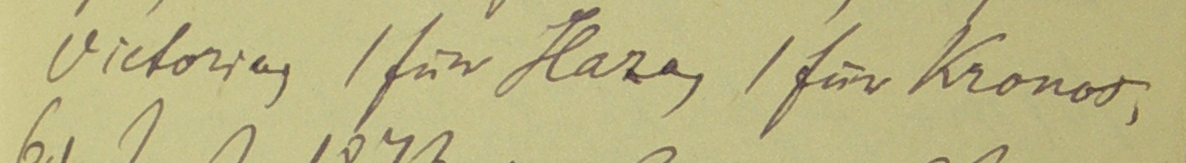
Victory, 1 für Tlara, 1 für Kronos.
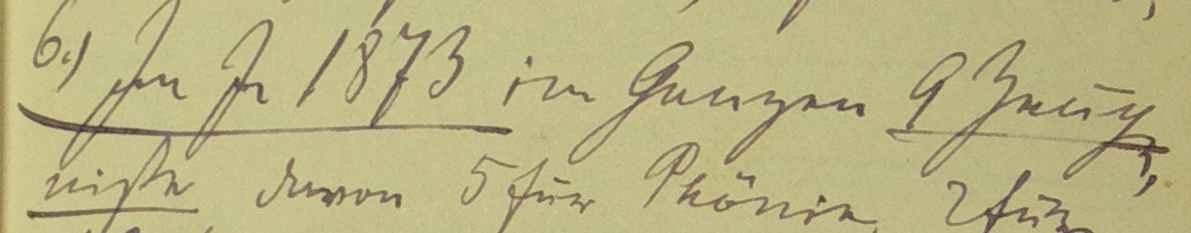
6) Im Jahre 1873 im ganzen 9 Zeug¬
